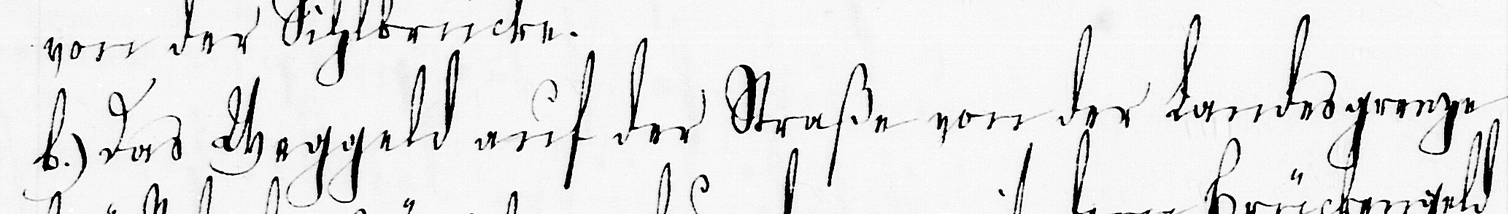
b.) Das Weggeld auf der Straße von der Landesgrenze
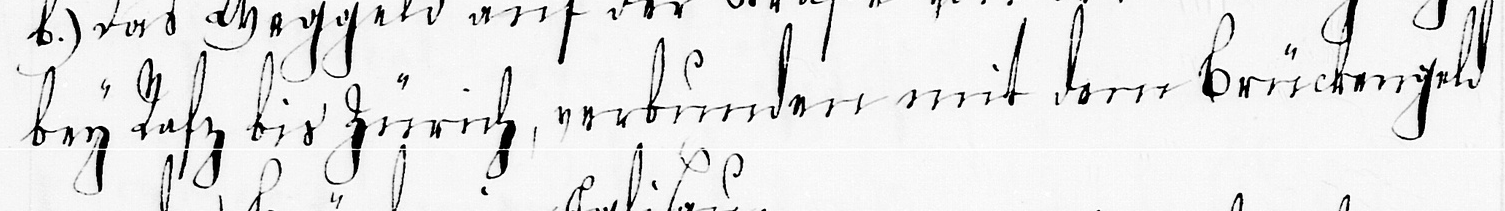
bey Rafz bis Zürich, verbunden mit dem Brückengeld
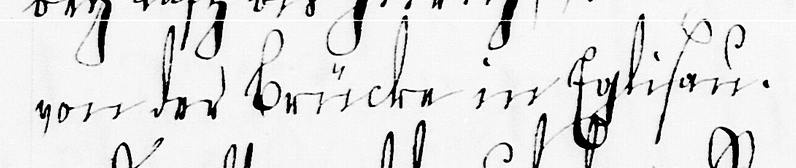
von der Brücke in Eglisau.
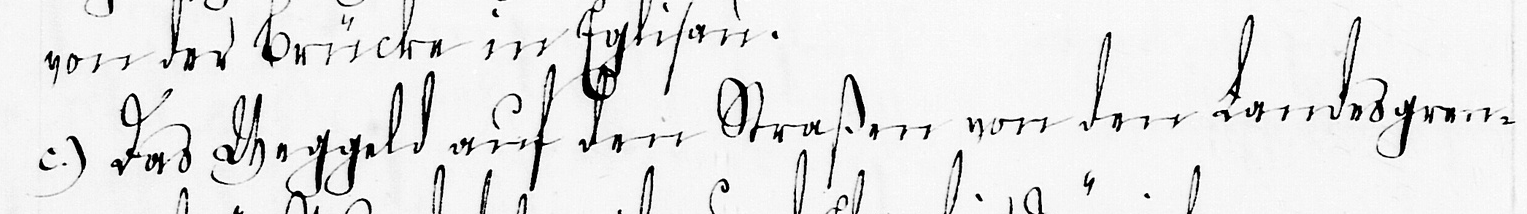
c.) Das Weggeld auf den Straßen von den Landesgren¬
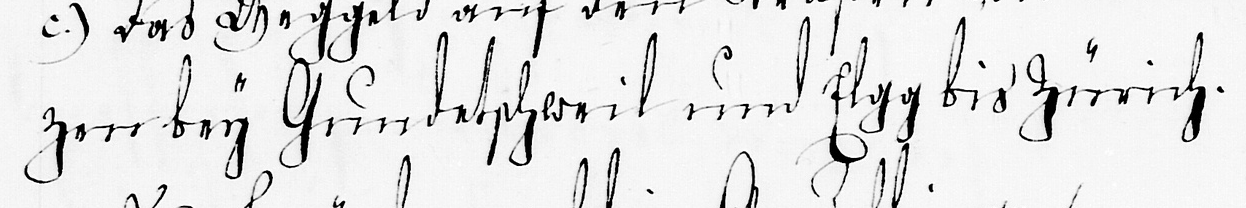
zen bey Gundetschweil und Elgg bis Zürich.
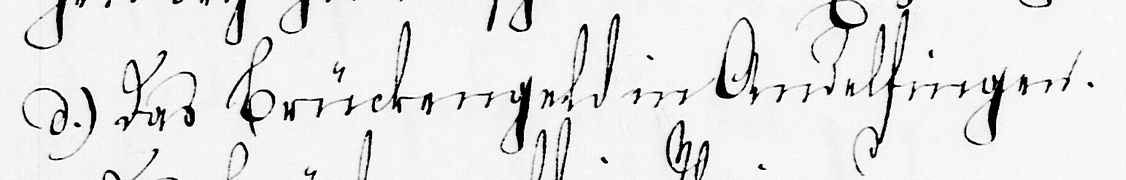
d.) Das Brückengeld in Andelfingen.
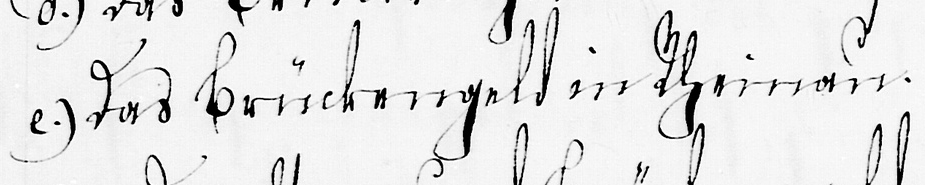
e.) Das Brückengeld in Rheinau.
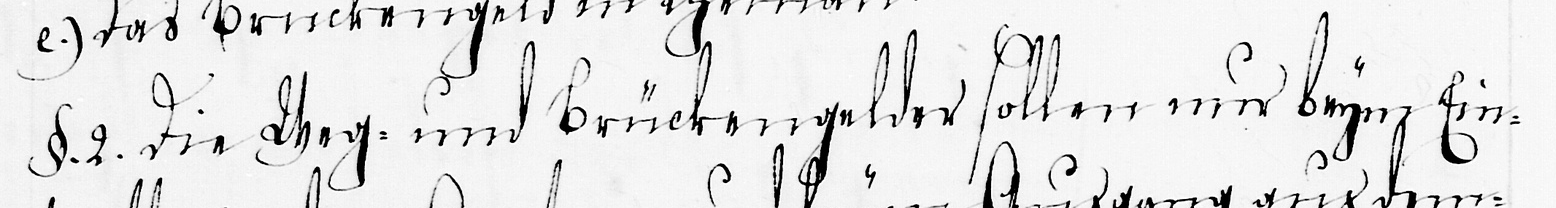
§. 2. Die Weg- und Brückengelder sollen nur beym Ein¬
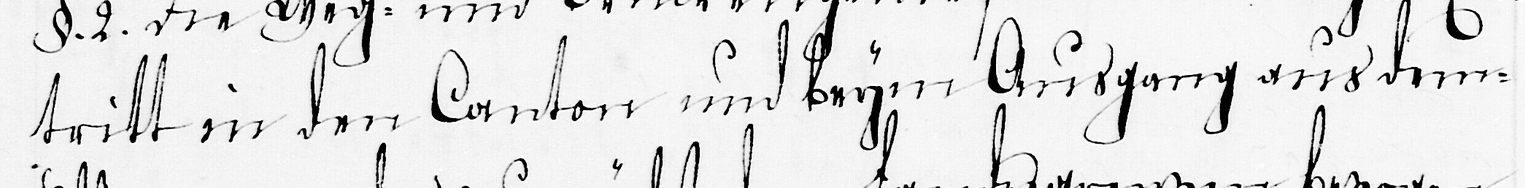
tritt in den Canton und beym Ausgang aus dem¬
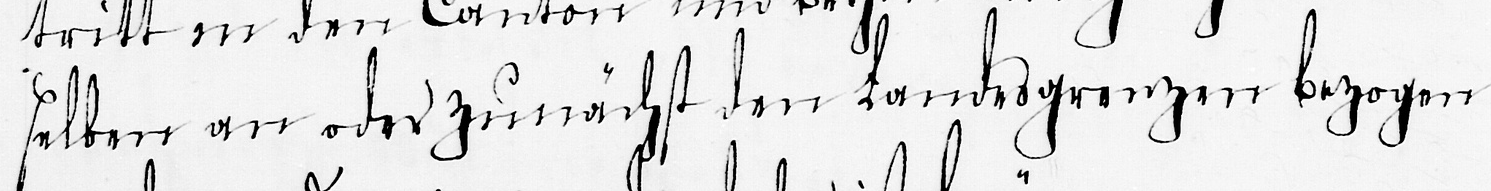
selben an oder zunächst den Landesgrenzen bezogen
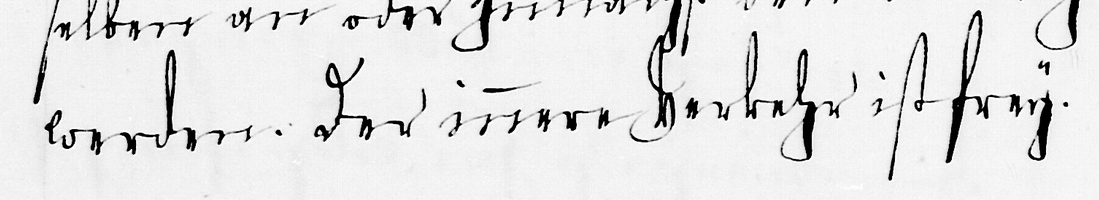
werde. Der innere Verkehr ist frey.
